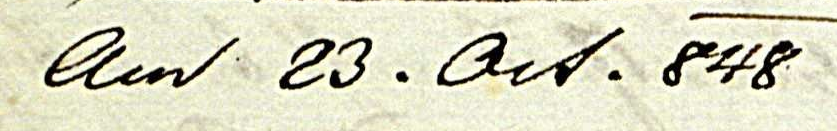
Am 23. Oct. 848
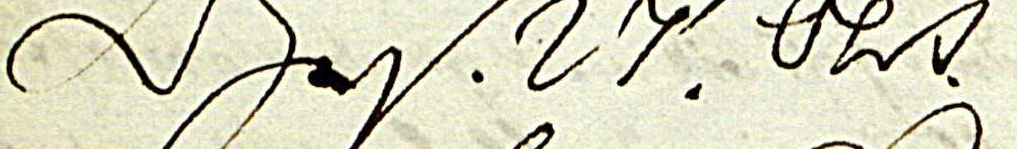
xxx. 27. Okt.
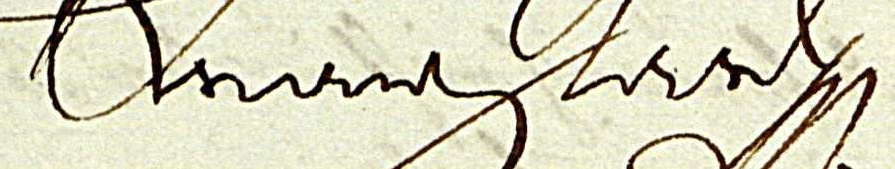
xxx Karl
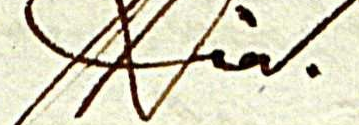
xxx.
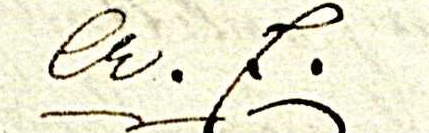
A. E.
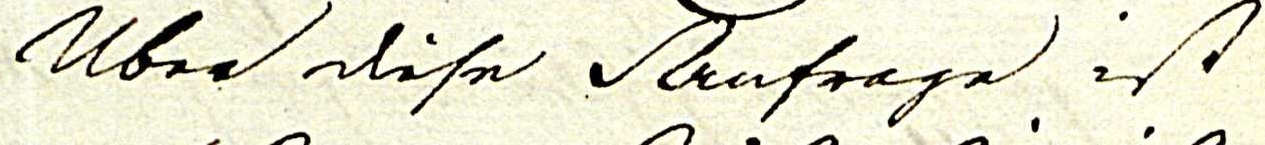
Über diese strafrage ist
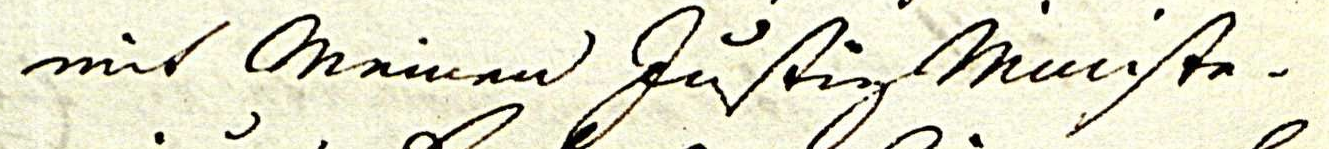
mit Meinen Justiz Ministe¬
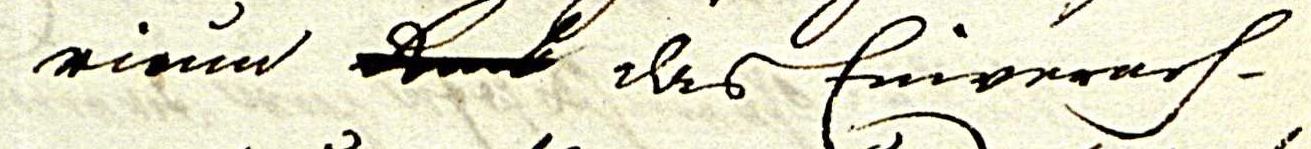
rium xxx das Einverach¬
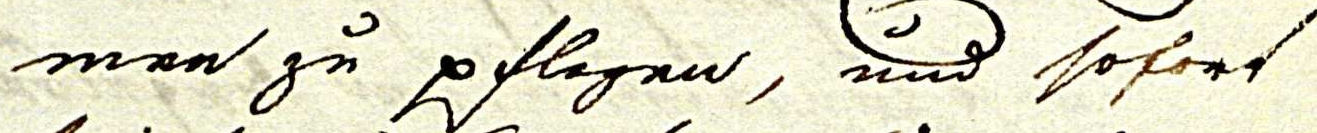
men zu pflegen, und sofort
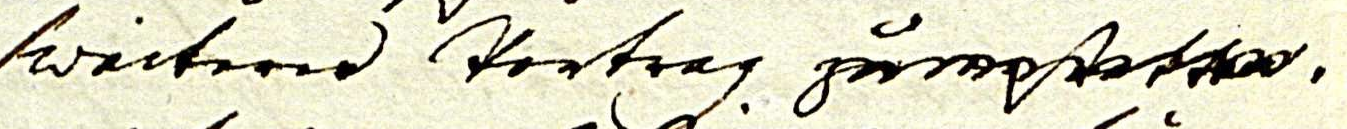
weiterer Vortrag. zuxxx
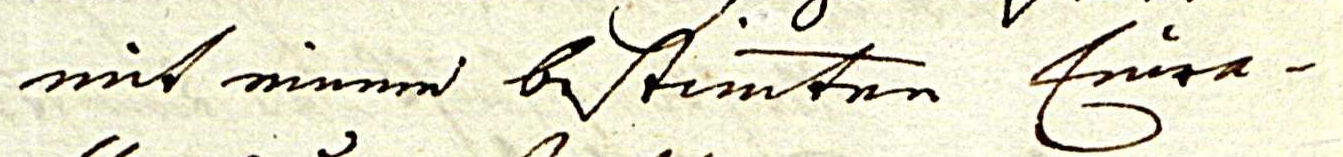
mit einem bestimmten Exxx¬
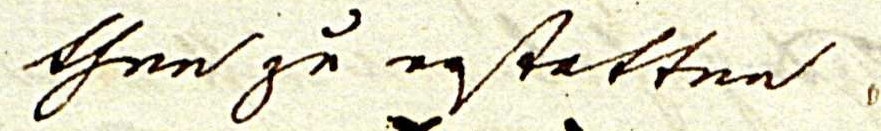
then zu erstatten.
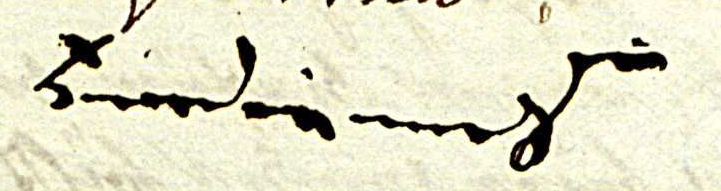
Ferdinanz
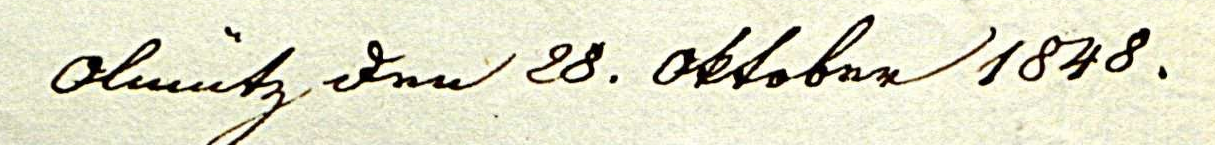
Olmütz den 28. Oktober 1848.
